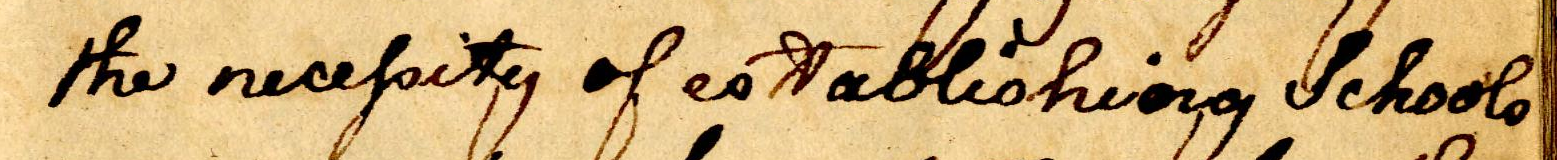the necessity of establishing Schools
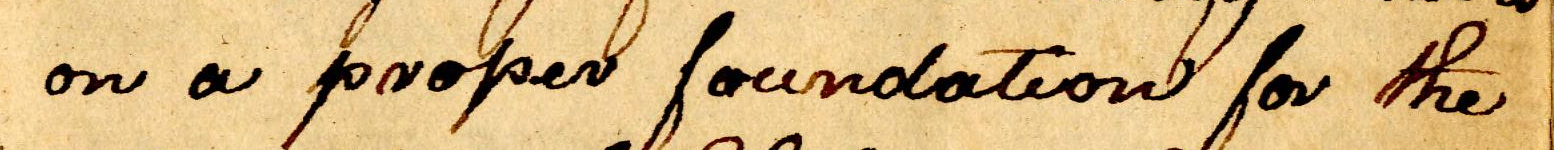on a proper foundation for the
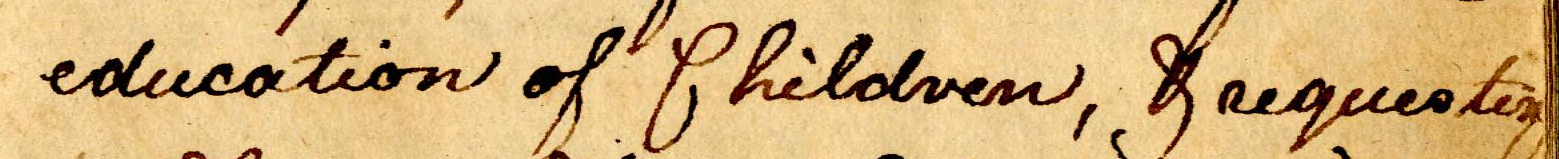education of Children, & requesting
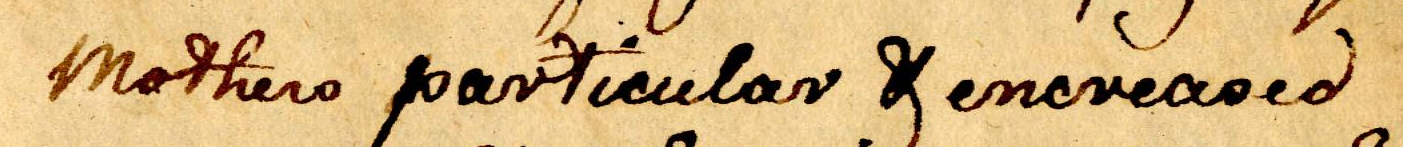Mothers particular & encreased
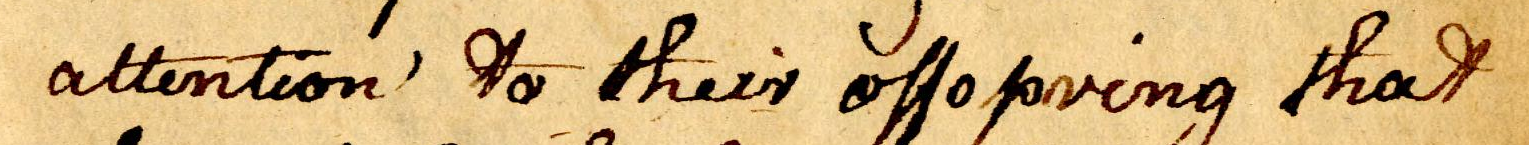attention to their offspring that
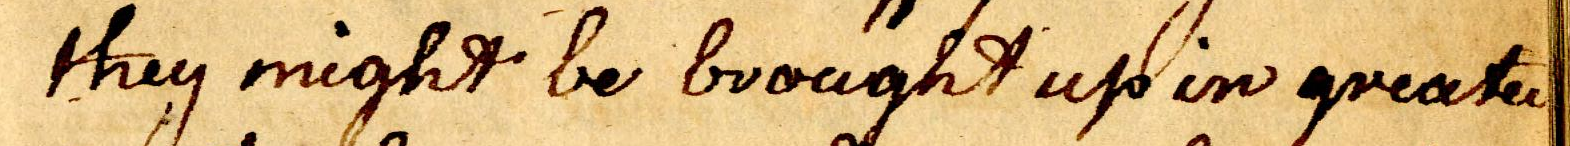they might be brought up in greater
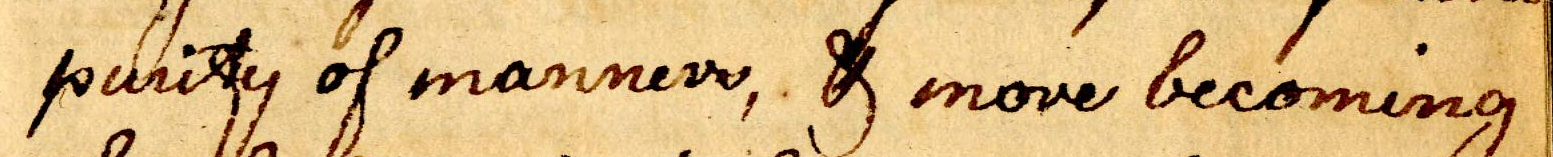purity of manners, & more becoming
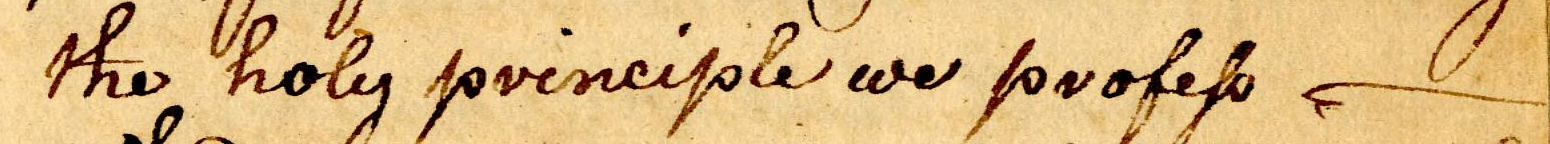the holy principle we profess-
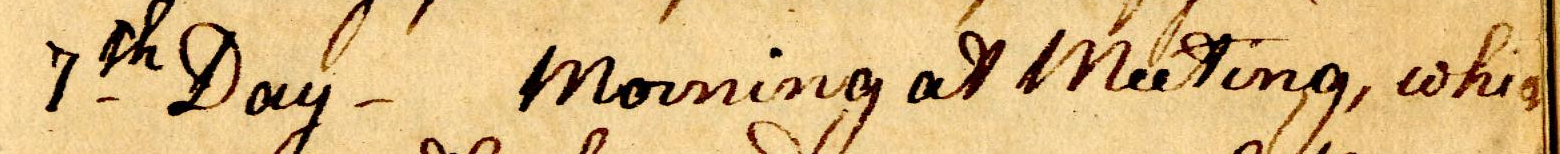7^th Day- Morning at Meeting, whic
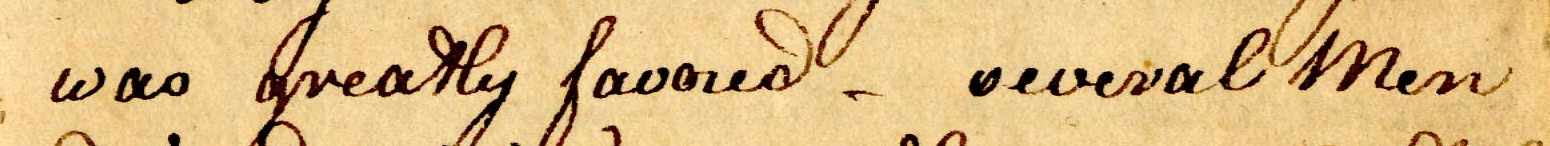was Greatly favored- several Men
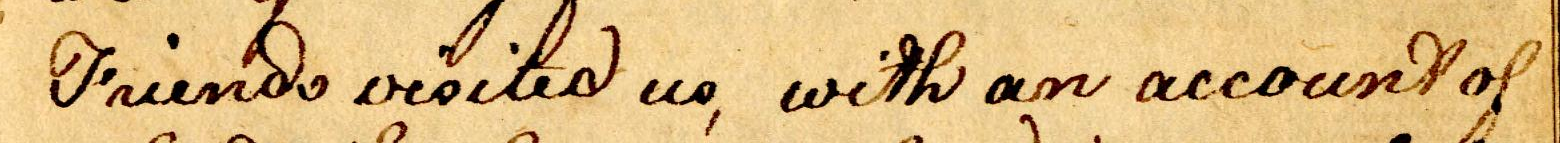Friends visited us, with an account of
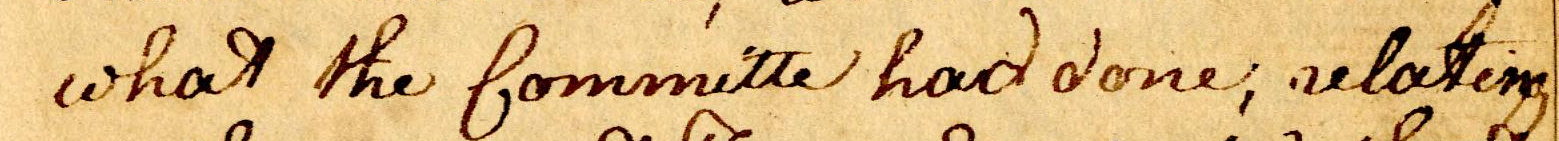what the Committe had done, relating
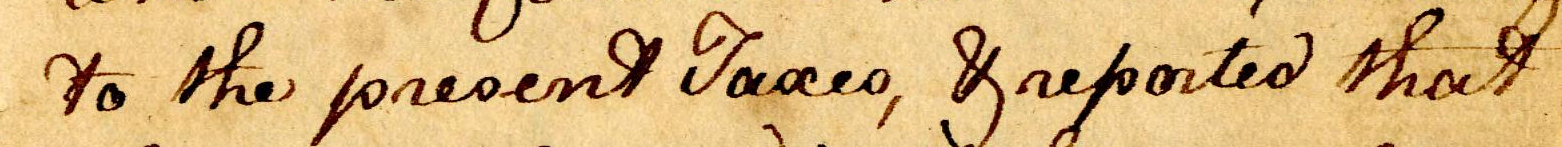to the present Taxes, & reported that
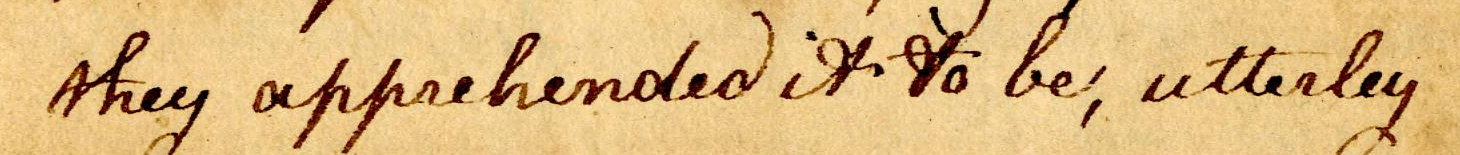they apprehended it to be, utterley
